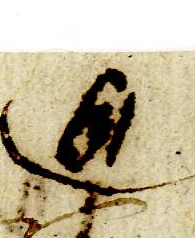61
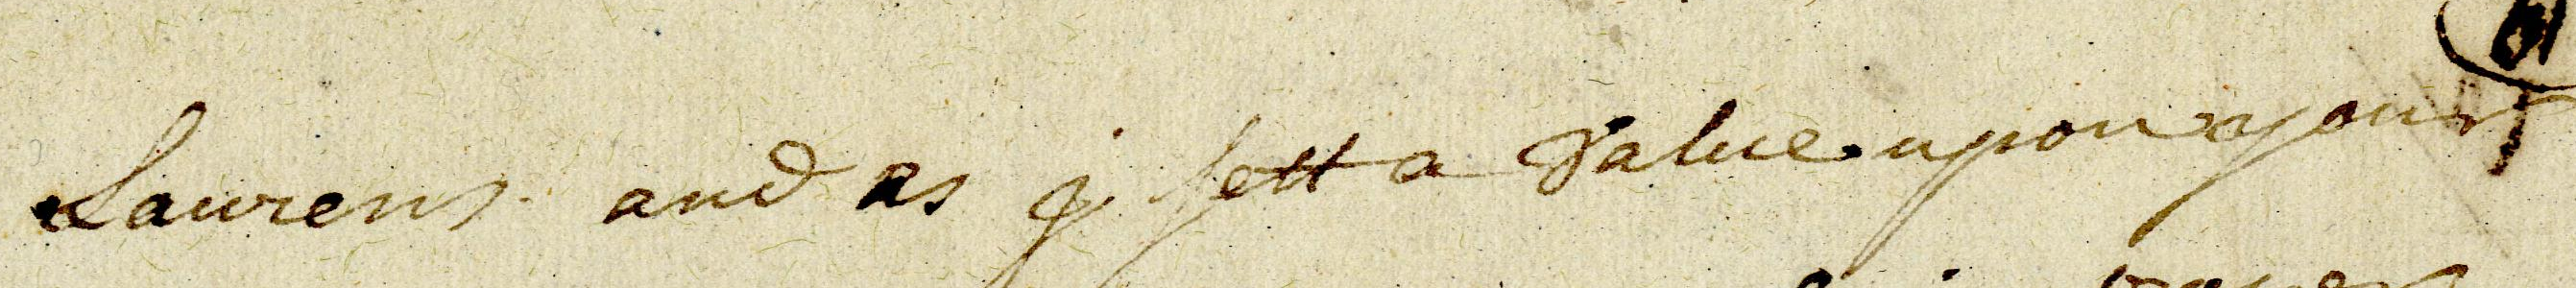Lawyers and as I sett a value upon your
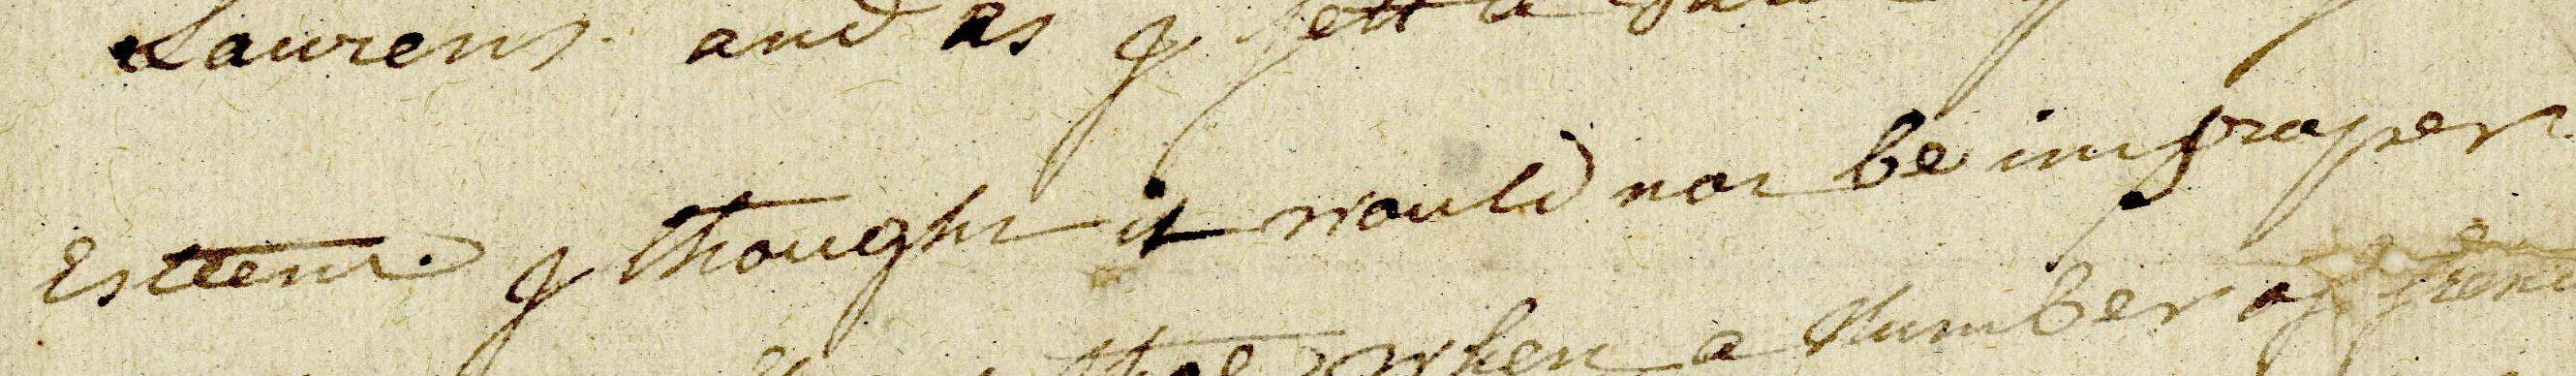Esteem I thought it would not be improper
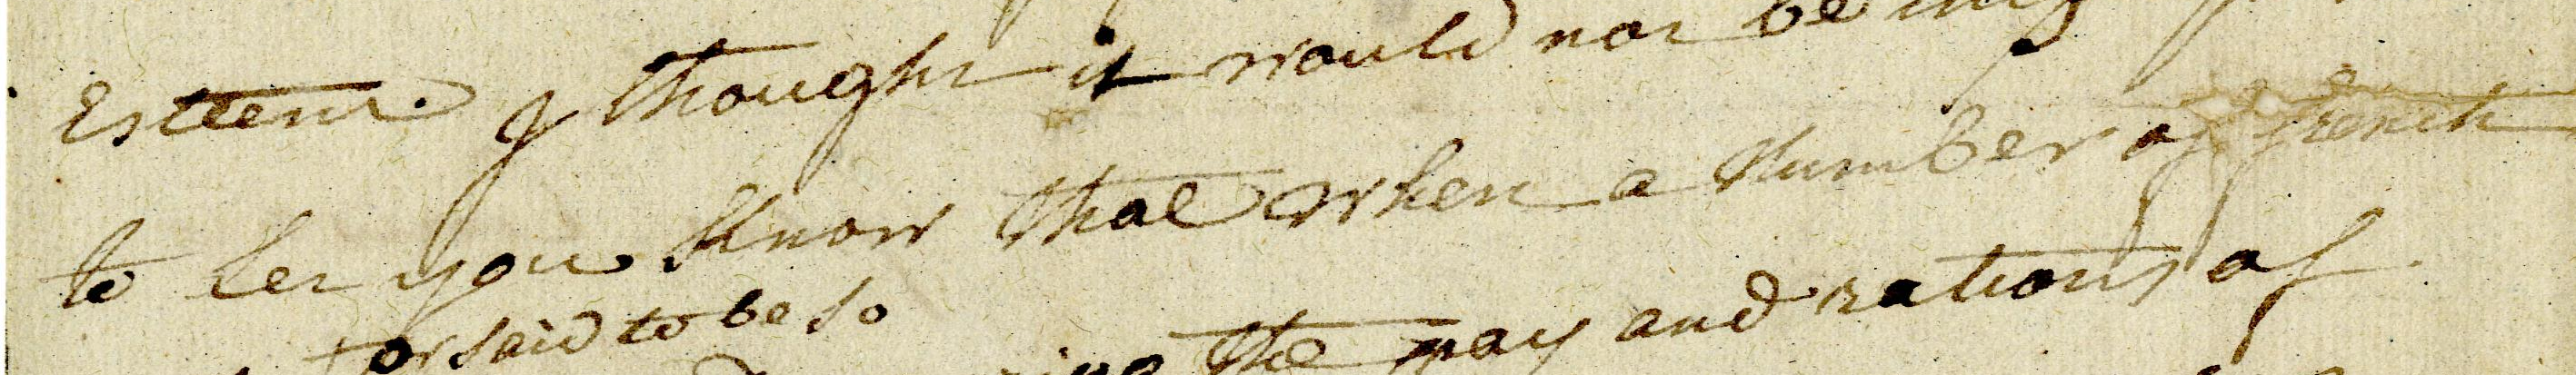to let you Know that when a Number of french
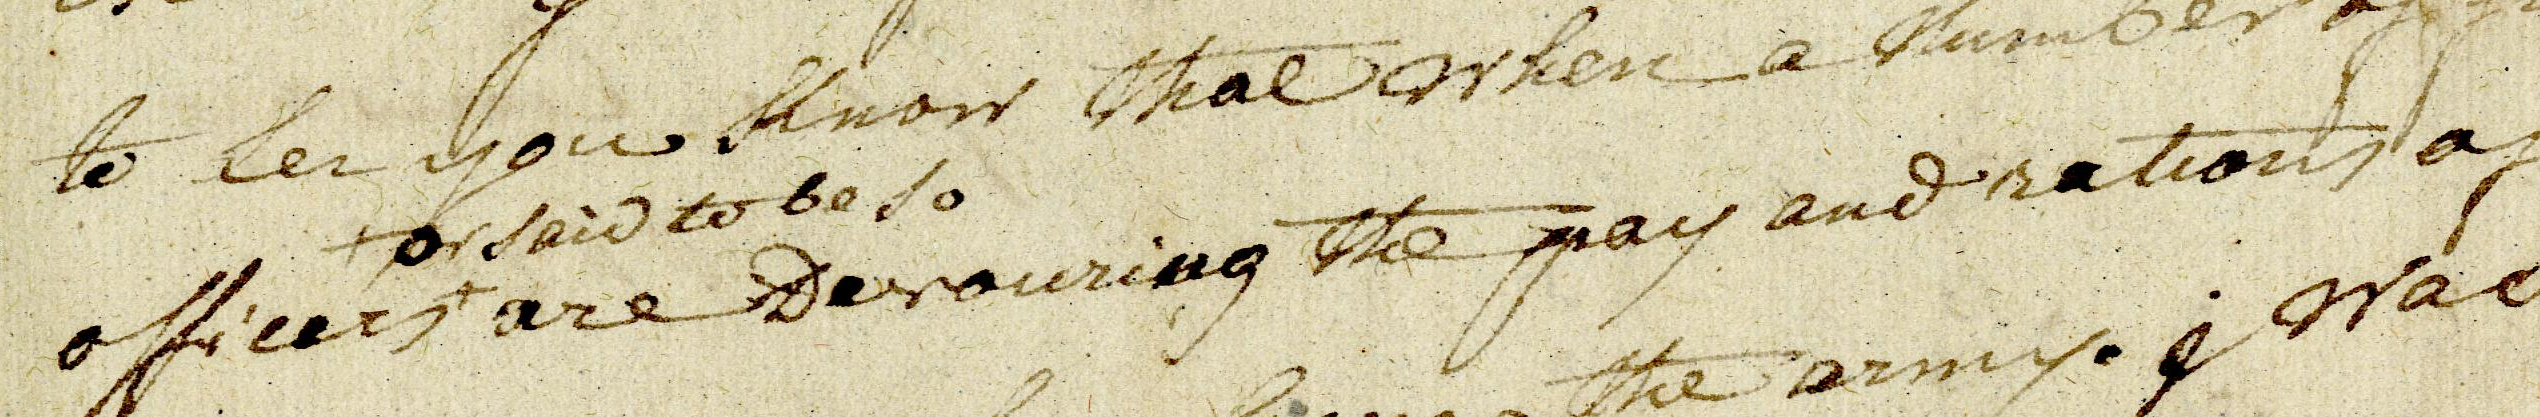officers + are devouring the pay and rations of
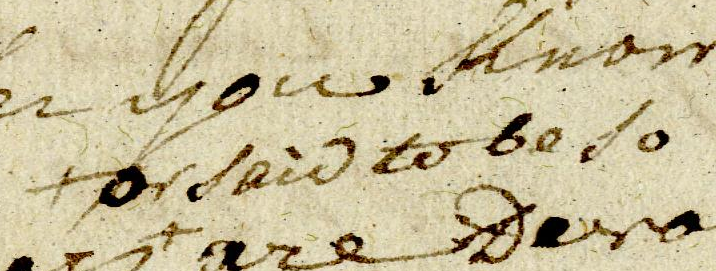+ or said to be so
